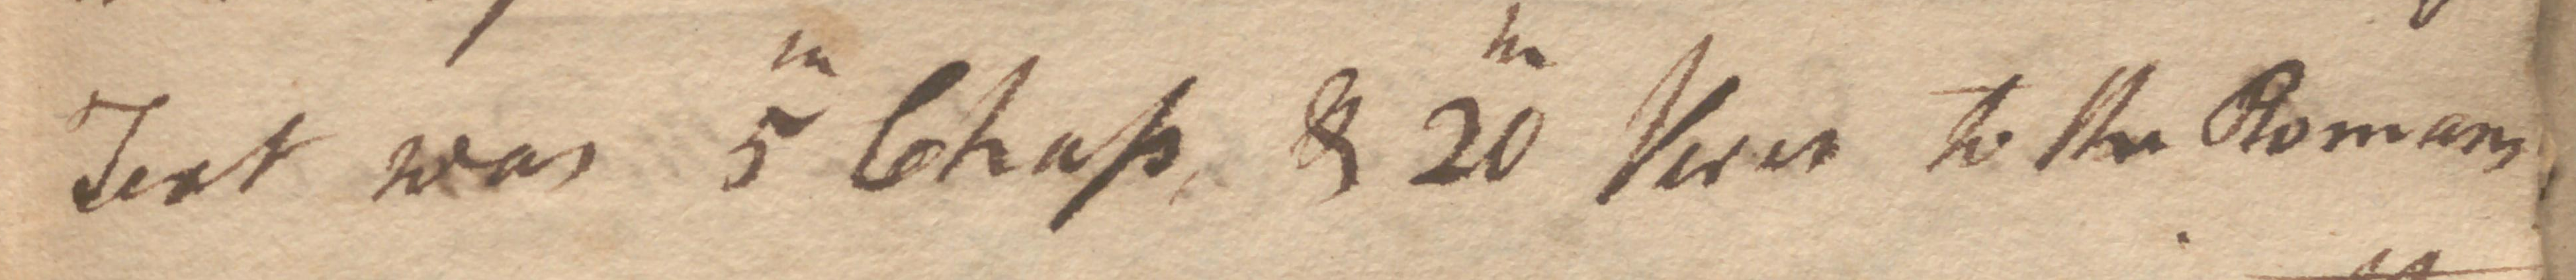Test was 5^th Chap & 20^th Veres to the Roman
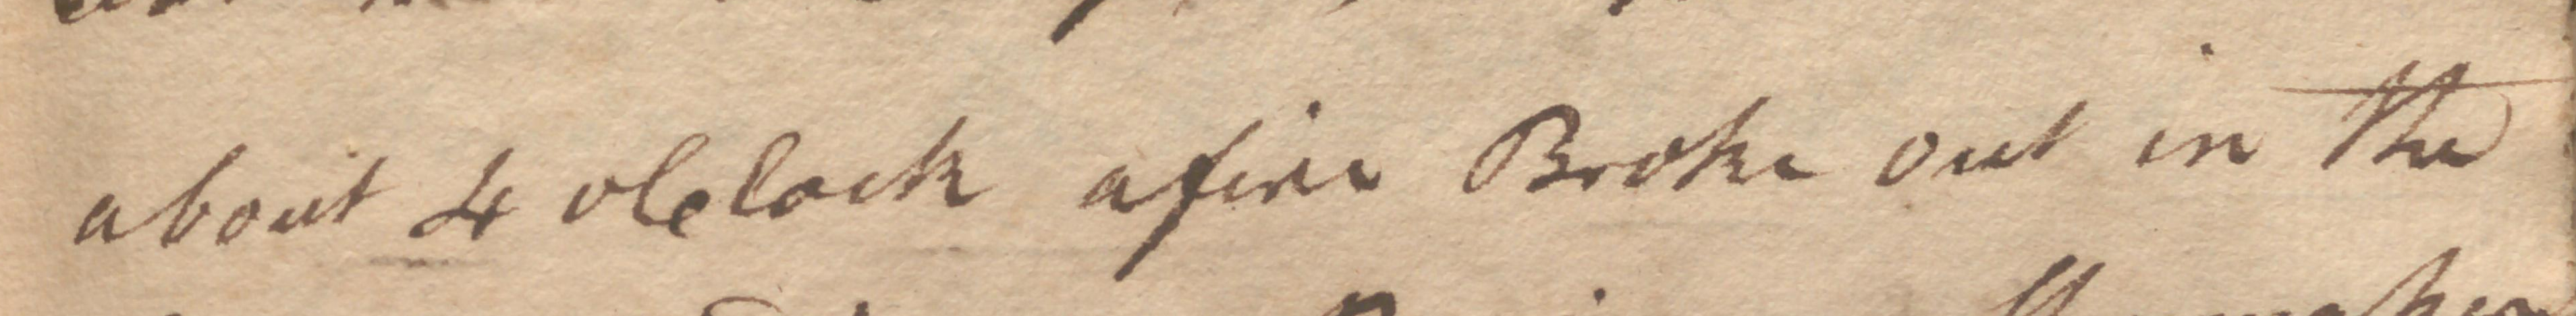about 4 oClock a fire Broke out in the
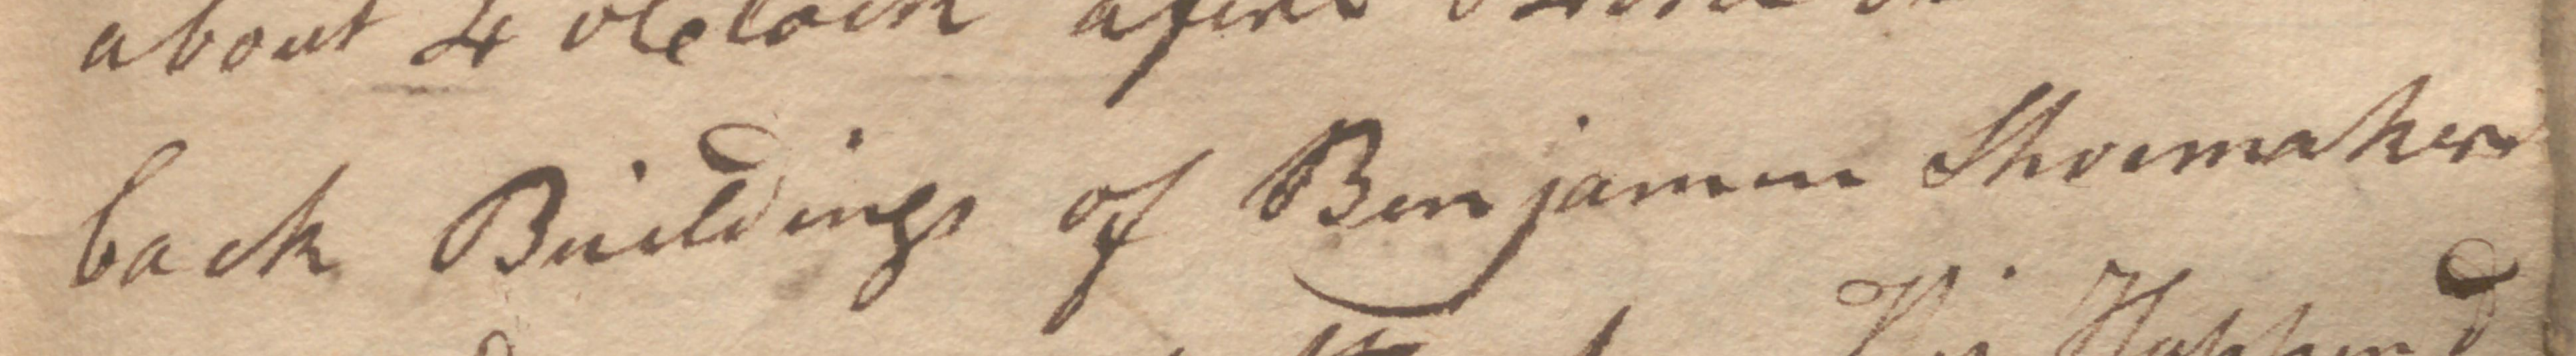back Buildings of Benjamin Shoemaker
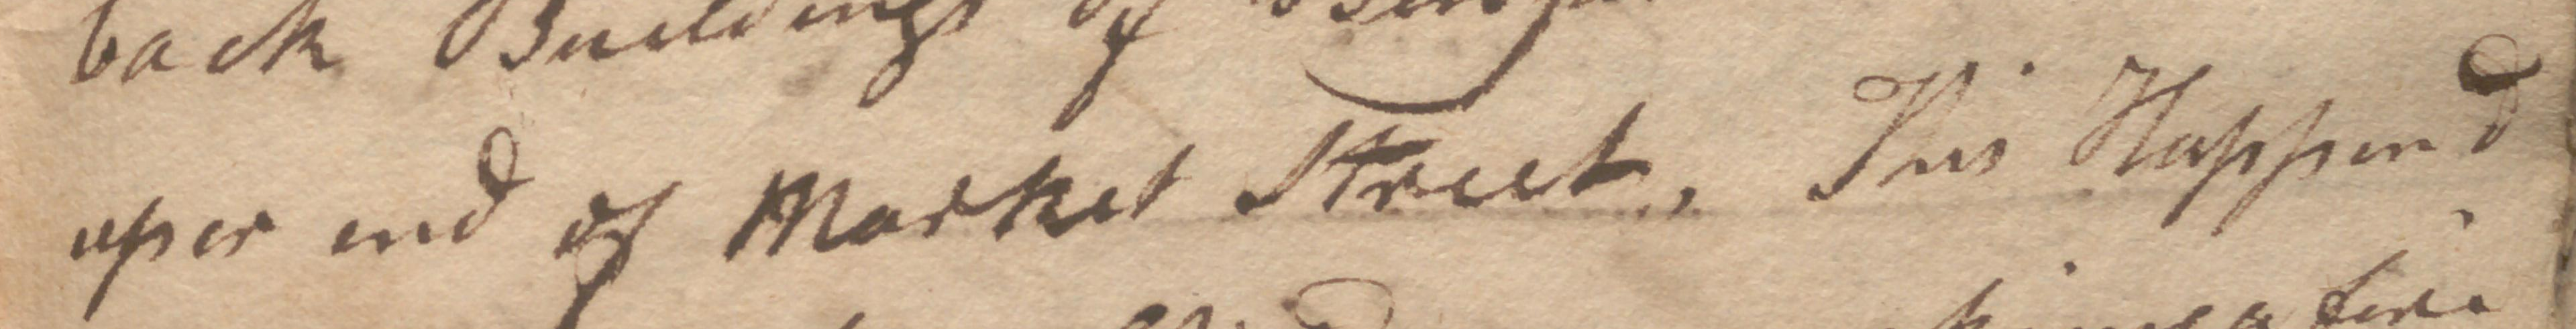uper end of Market Street, This Happend
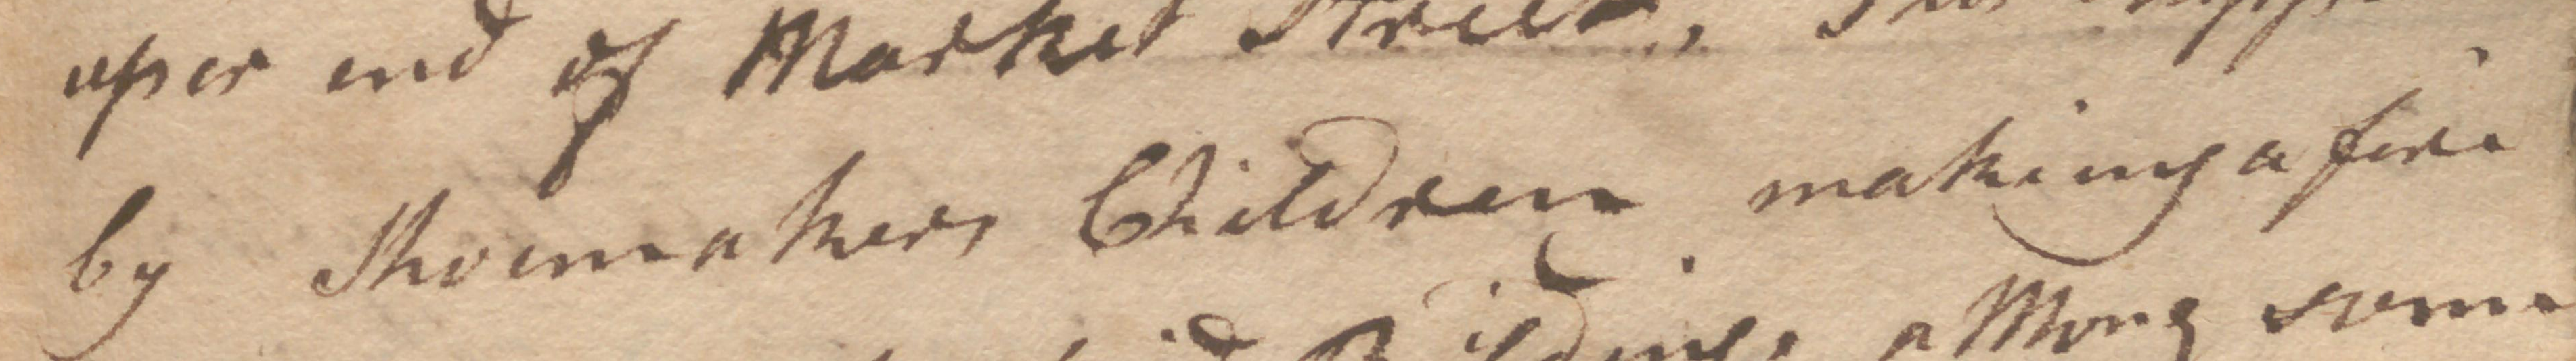by Shoemakers Children makeing a fire
